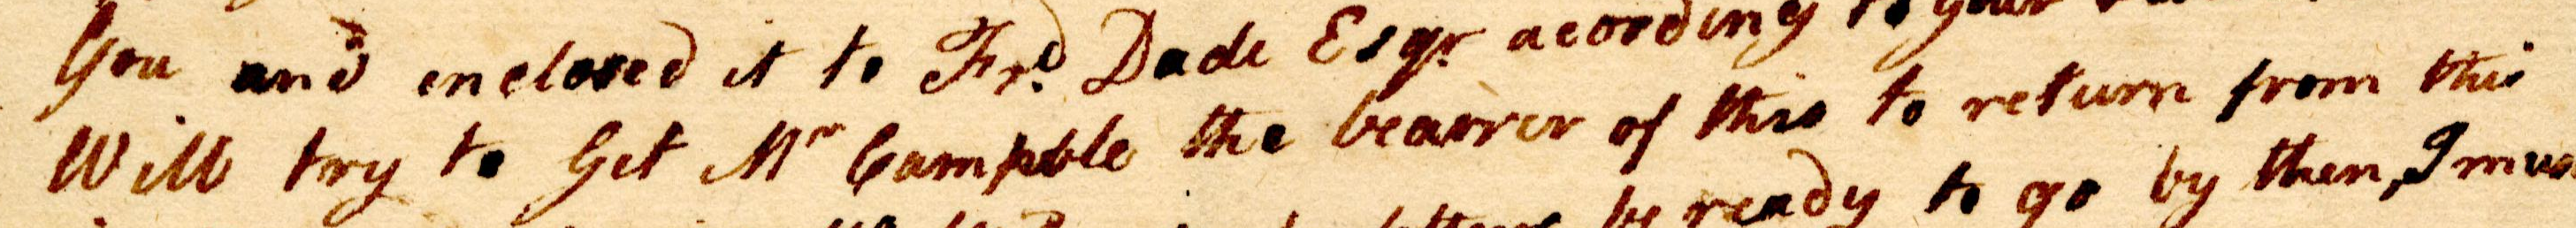will try to get M^r Campble the bearer of this to return from this
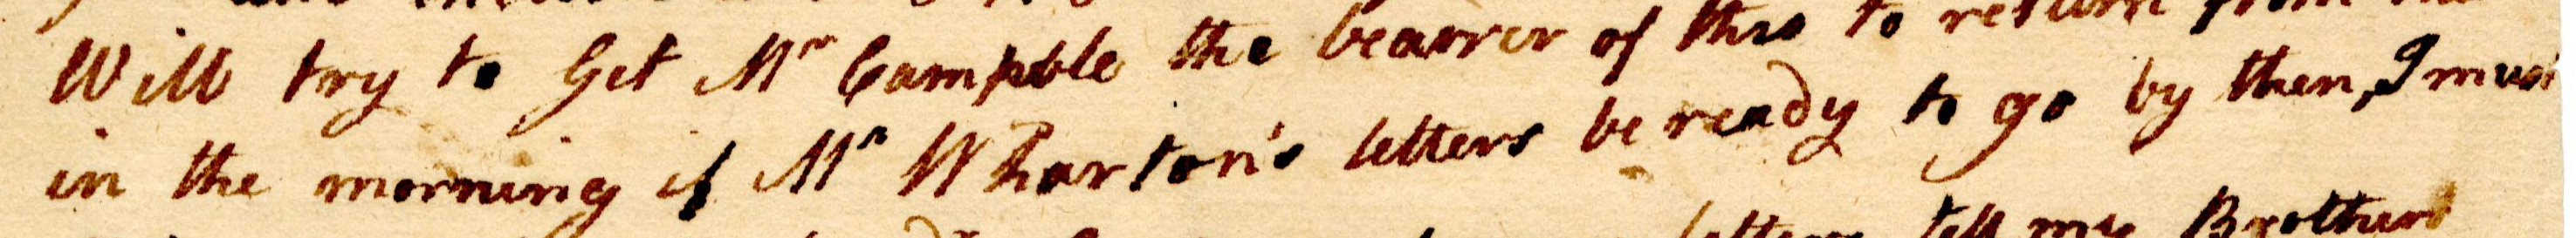in the morning if M^r. Wharton's letters be ready to go by then I must
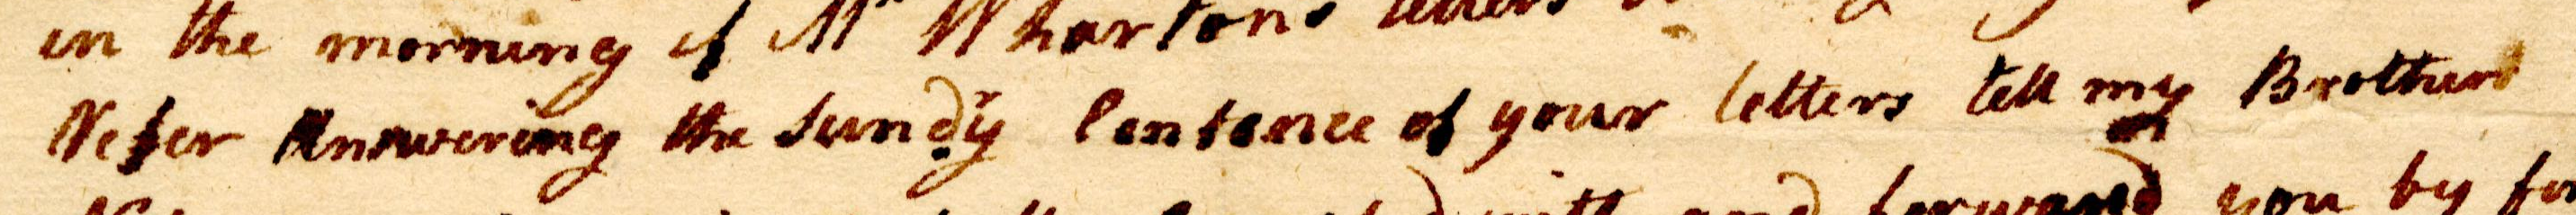refer Answering the sund^ry Centence of your letters tell my Brother
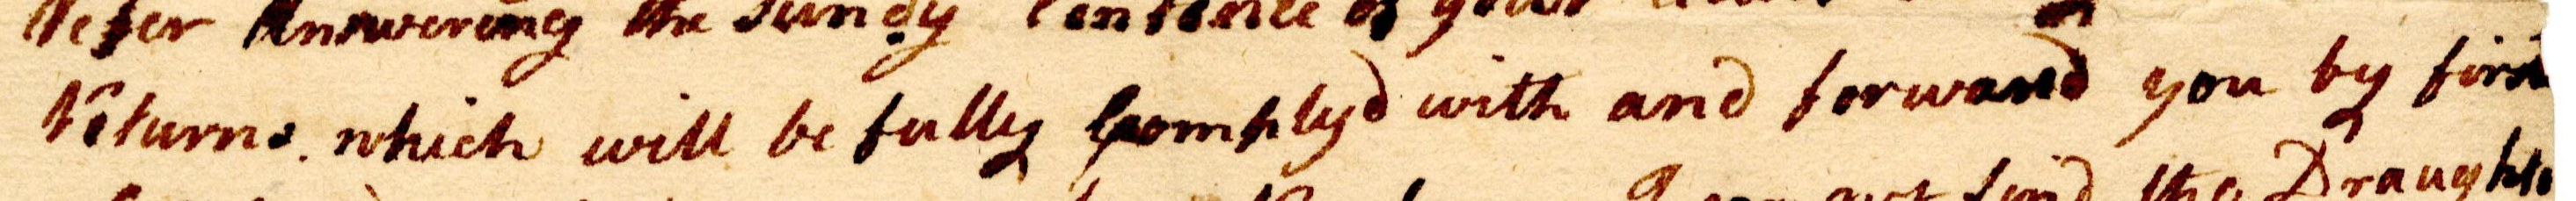returns which will be fully Comply'd with and forward you by first
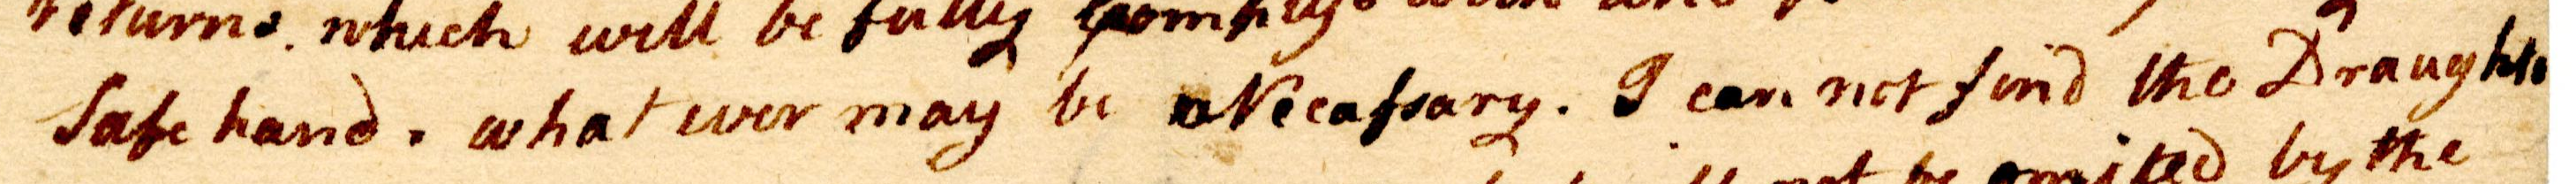safe hand. what ever may be a Necassary. I can not find the Draughte
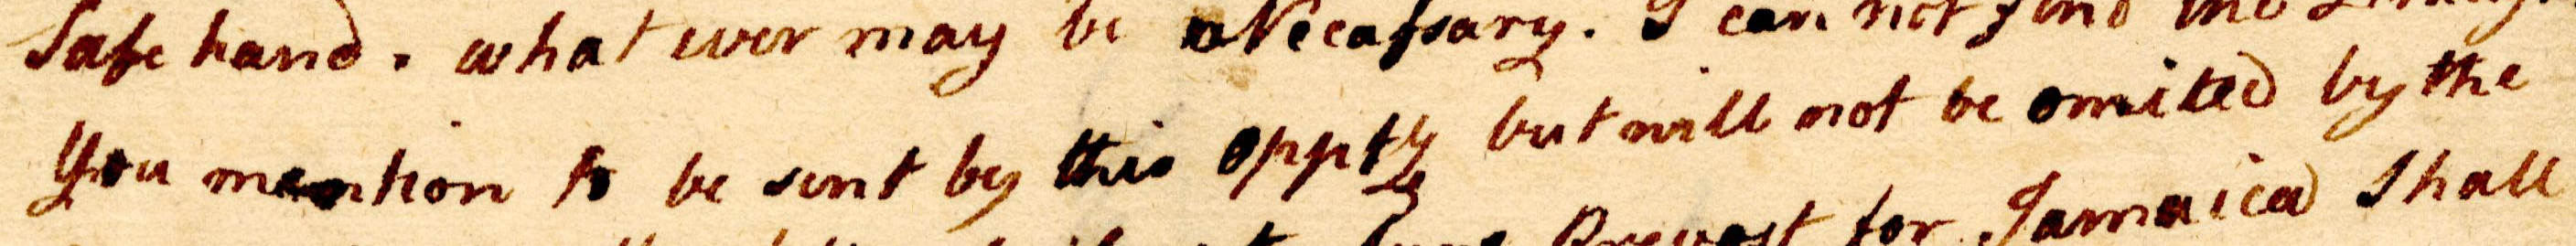you mention to be sent by this oppty but will not be omited by the
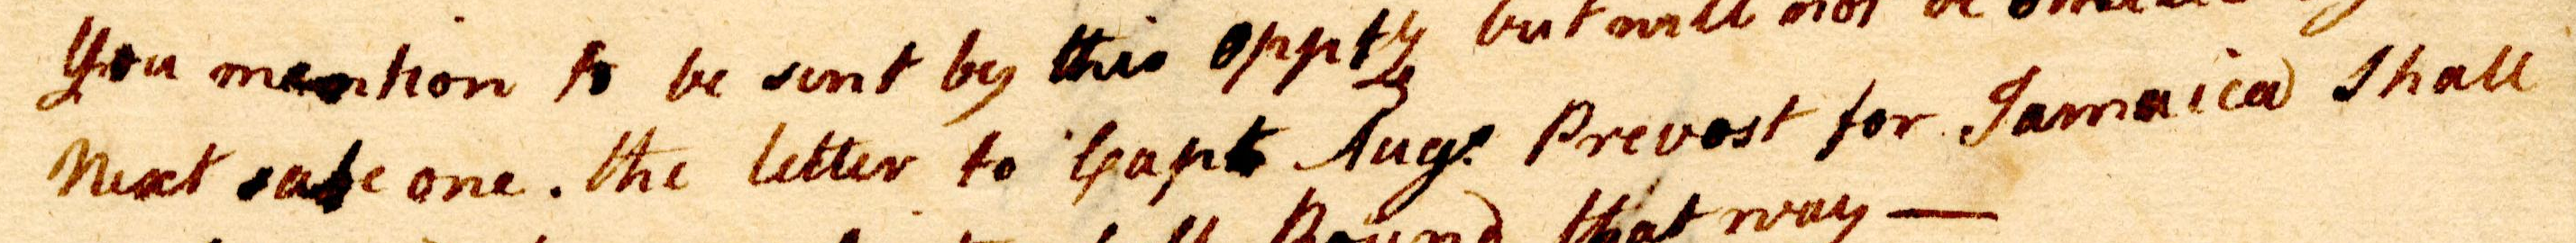next safe one. the letter to Capts Rug^s. Prevost for Jamaica shall
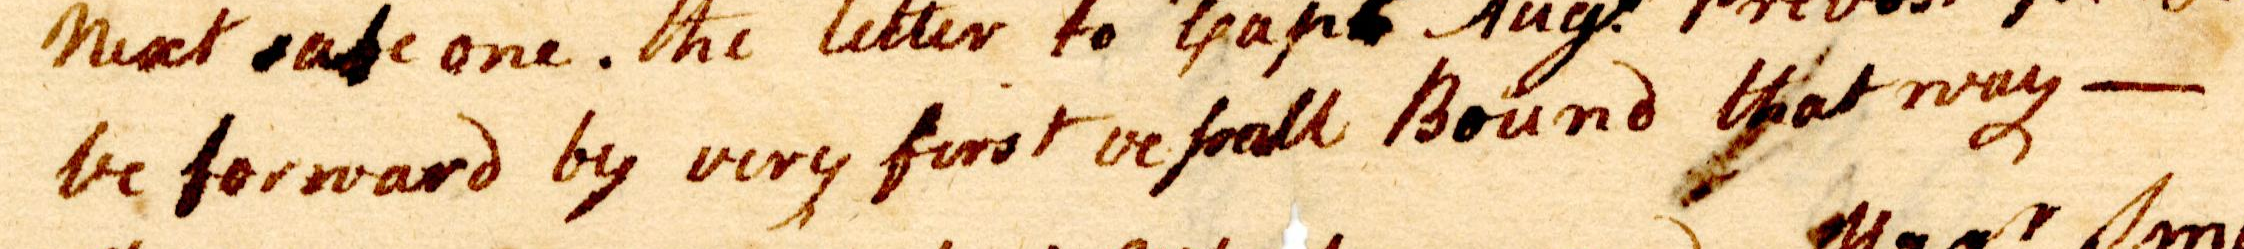be forward by very first vessell Bound that way-
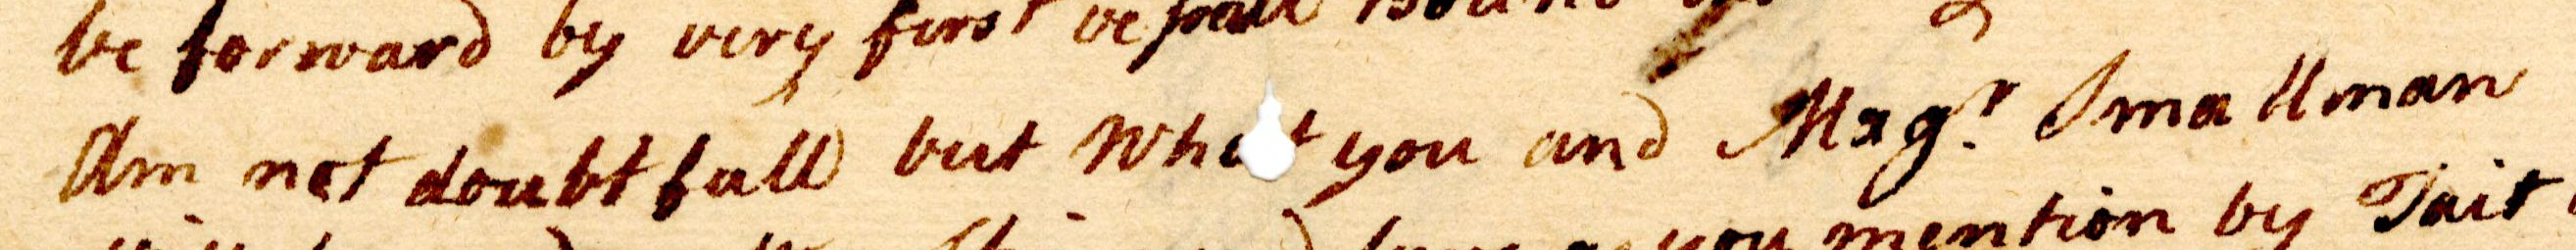Am not doubtfull but what you and Mag^r. Smallman
